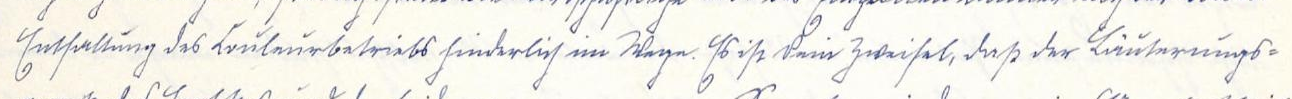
Entfaltung des Couleurbetriebs hinderlich im Wege. Es ist kein Zweifel, dass der Läuterungs-
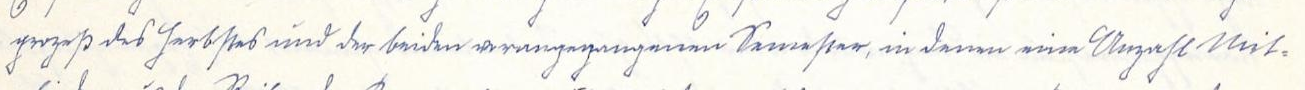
prozeß des Herbstes und der beiden vorangegangenen Semester, in denen eine Anzahl Mit-
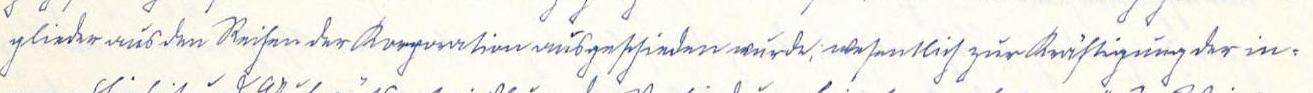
gliede aus den Reihen der Korporation ausgeschieden wurde, wesentlich zur Kräftigung der in-
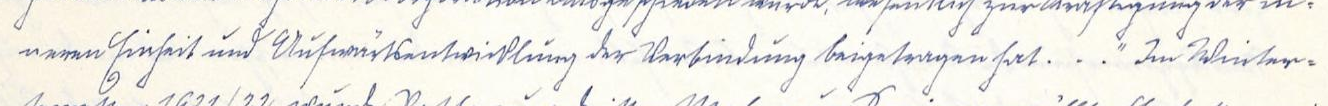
neren Einheit und Aufwärtsentwicklung der Verbindung beigetragen hat. Im Winter-
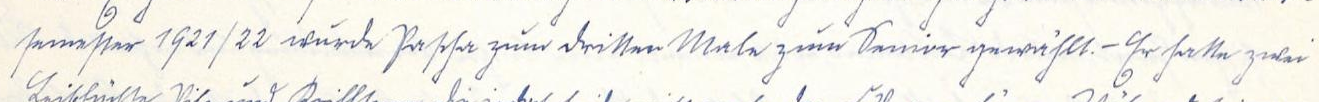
Semester 192/22 wurde Pascha zum dritten Male zum Senior gewählt.- Er hatte zwei
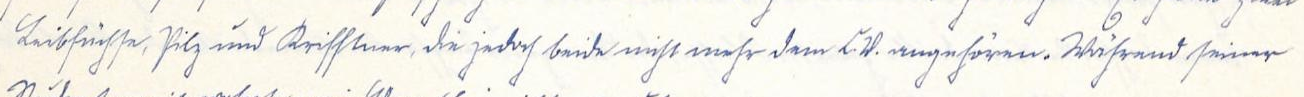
Leibfüchse, Pilz und Krifftner, die jedoch beide nicht mehr dem CV angehören. Während seiner
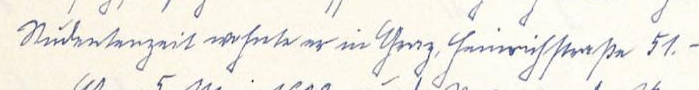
Studentenzeit wohnte er in Graz, Heinrichstraße 51.
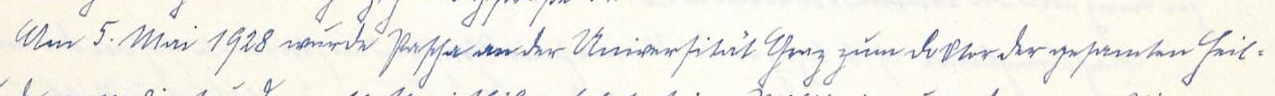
Am 5. Mai 1928 wurde Pascha an der Universität Graz zum Doktor der gesamten Heil-
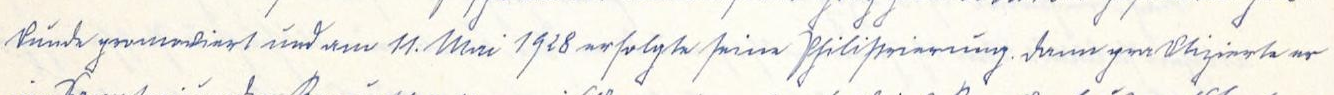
kunde promoviert und am 11. Mai 1928 erfolgte seine Philistrierung. Dann praktizierte er
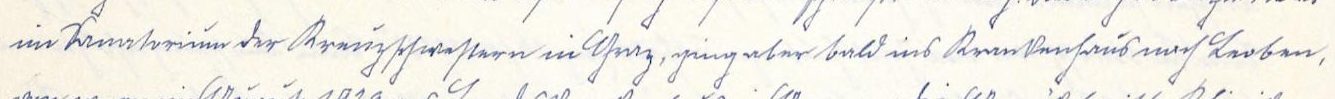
im Sanatorium der Kreuzschwestern in Graz, ging aber bald ins Krankenhaus nach Leoben,
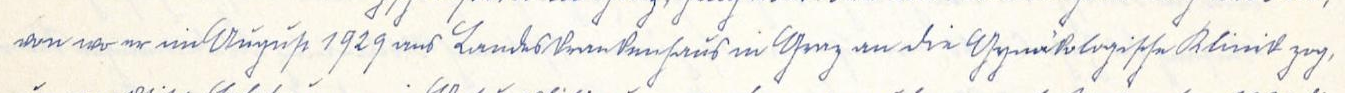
von wo er im August 1929 ins Landeskrankenhaus in Graz an die Gynäkologische Klinik zog
